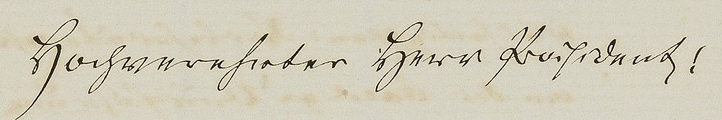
Hochverehrter Herr Präsident!
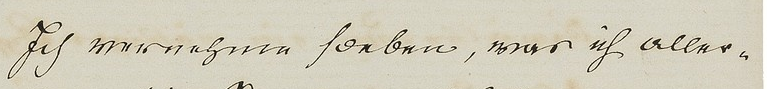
Ich vernehme soeben, was ich aller-
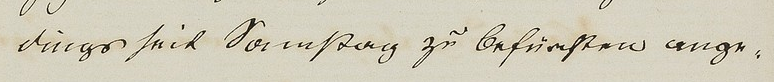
dings seit Samstag zu befürchten ange-
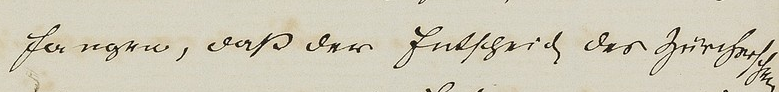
fangen, daß der Entscheid des Zürcherischen
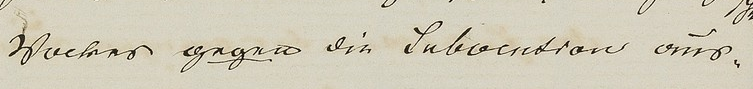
Volkes gegen die Subvention aus-
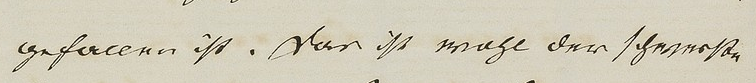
gefallen ist. Das ist wohl der schwerste
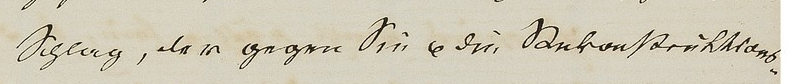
Schlag, der gegen Sie & die Rekonstruktions-
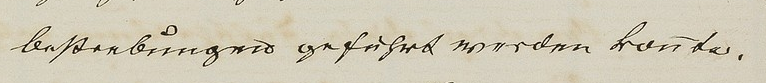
bestrebungen geführt werden konnte.
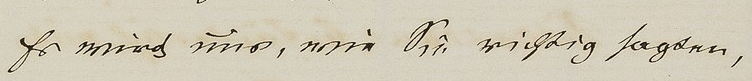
Es wird uns, wie Sie richtig sagten,
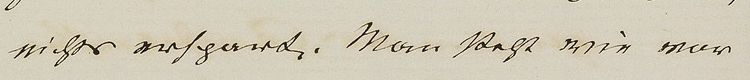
nichts erspart. Man steht wie vor
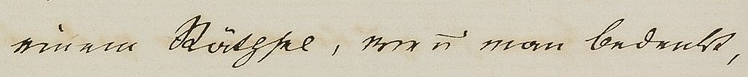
einem Räthsel, wenn man bedenkt,
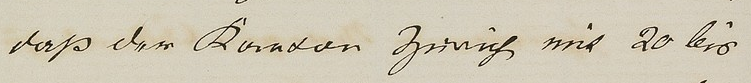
daß der Kanton Zürich mit 20 bis
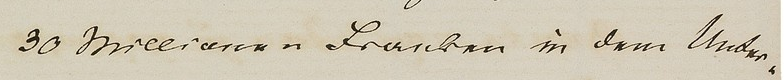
30 Millionen Franken in dem Unter-
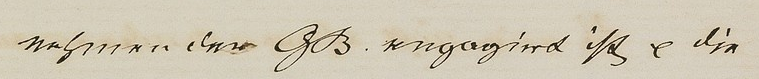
nehmen der GB. engagirt ist & die
